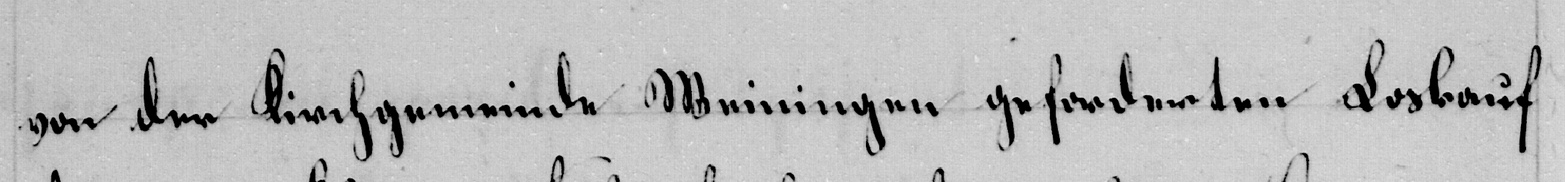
von der Kirchgemeinde Weiningen geforderten Loskauf
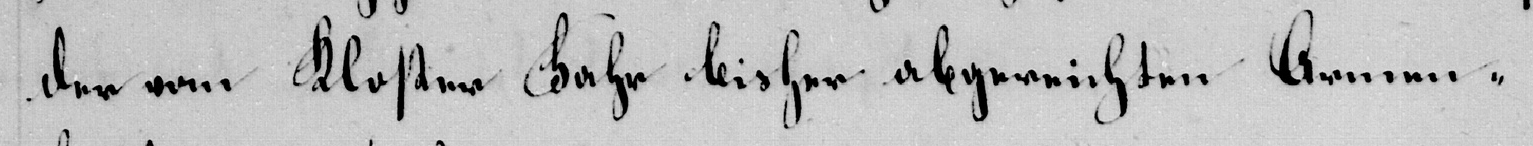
der vom Kloster Fahr bisher abgereichten Armen¬
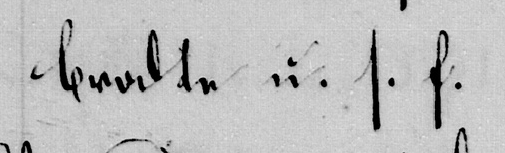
brodten u. s. f.
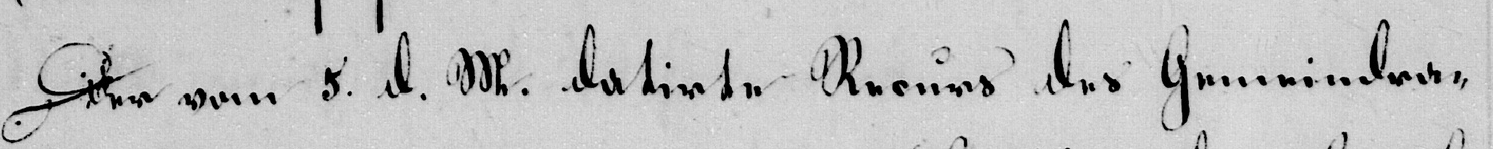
Der vom 5. d. M. datirte Recurs des Gemeindra¬
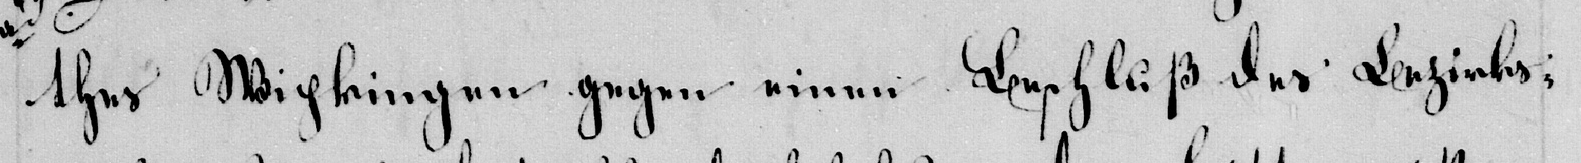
thes Wipkingen gegen einen Beschluß des Bezirks¬
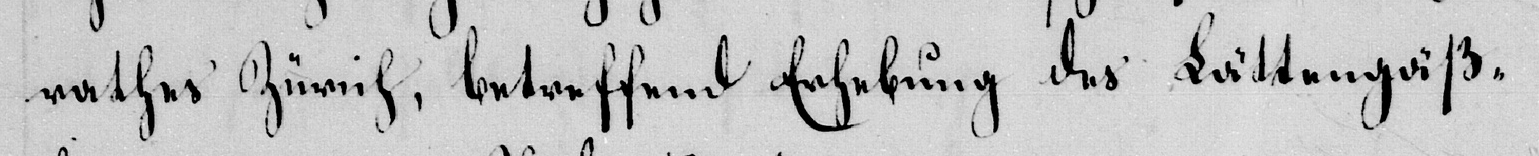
rathes Zürich, betreffend Erhebung des Lättengäß¬
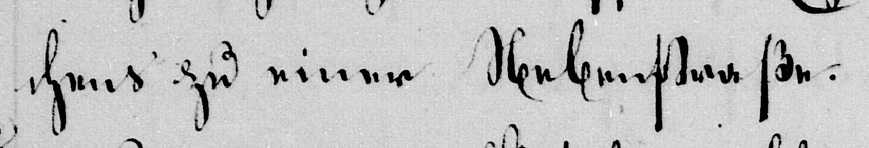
chens zu einer Nebenstraße.
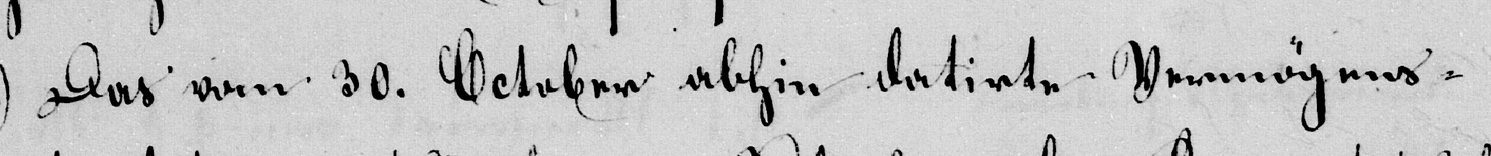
Das vom 30. October abhin datirte Vermögens¬
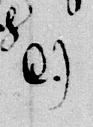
b.)
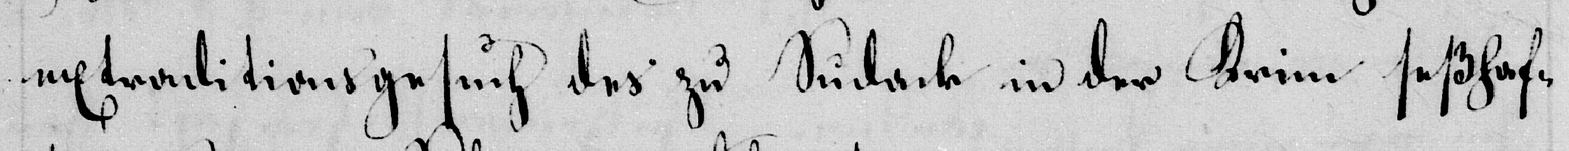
extraditionsgesuch des zu Sudack in der Krim seßhaf¬
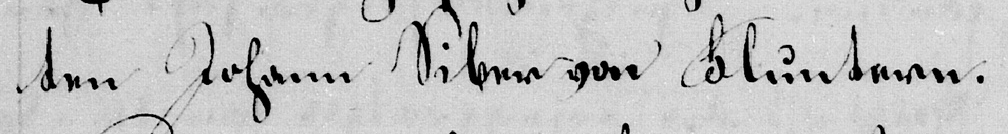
ten Johann Siber von Fluntern.
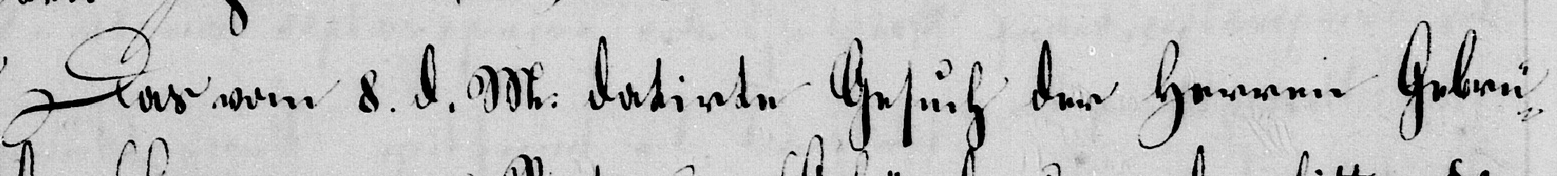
Das vom 8. d. M. datirte Gesuch der Herren Gebrü¬
